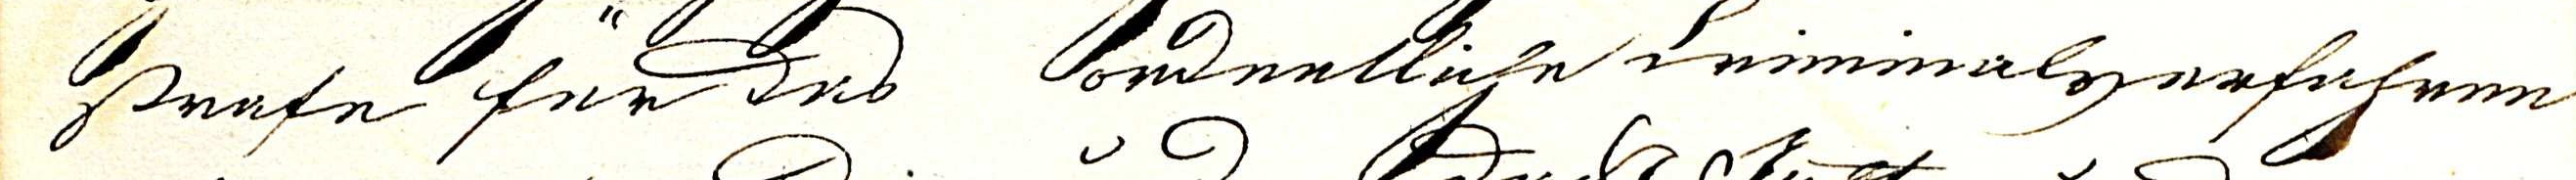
strafe für das ordentliche Criminalsverfahren
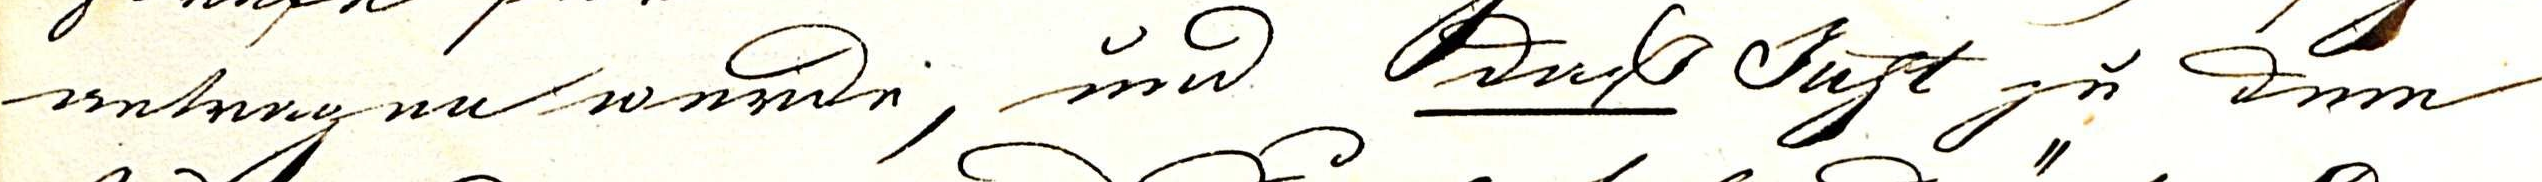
antragen werden, und daß Just zu dem
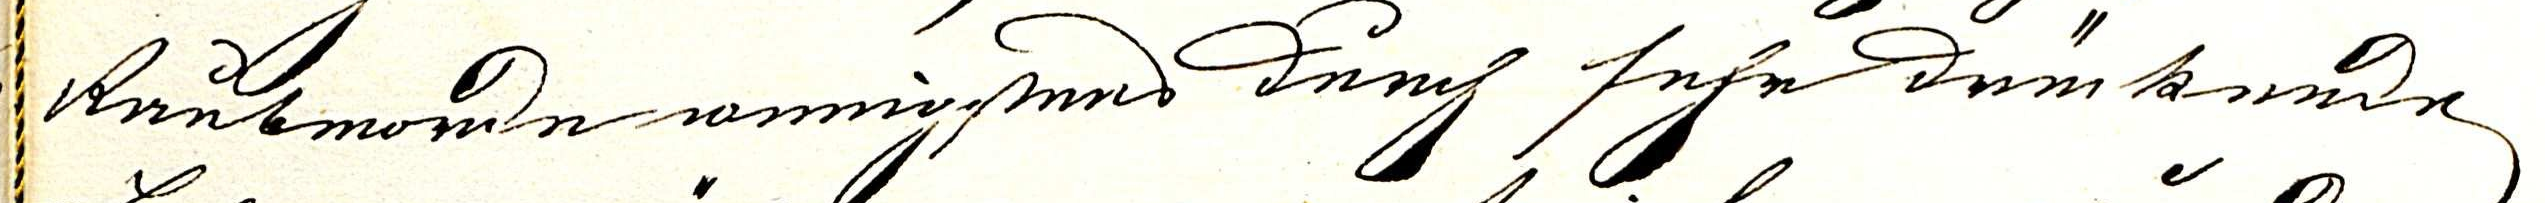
Raubmorde wenigstens durch sehr drückende
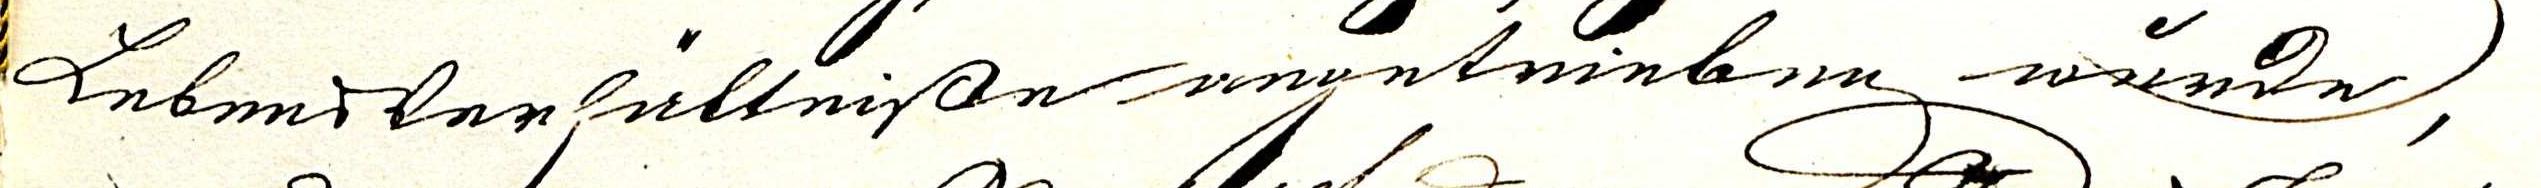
Lebensverhältniße angetrieben wurde,
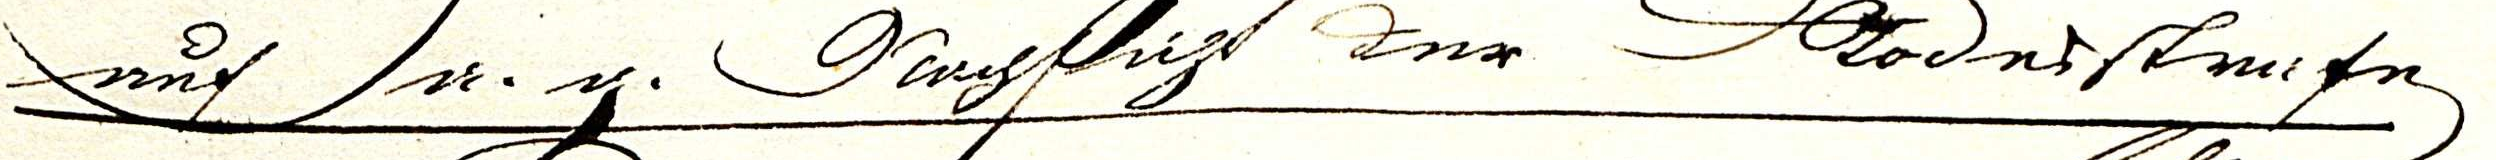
auf a.g. Nachsicht der Todesstrafe
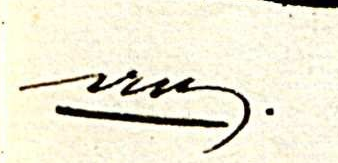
an.
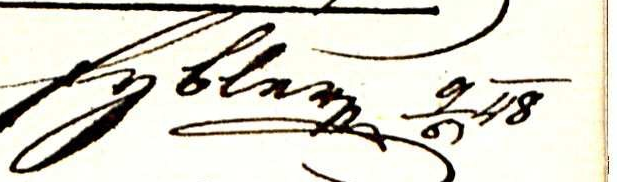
Eybler 9/6 [18]48
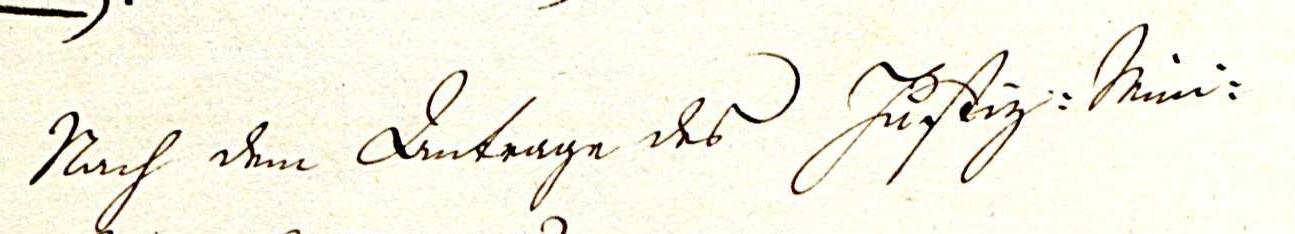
Nach dem Antrage des Justiz:Mini¬
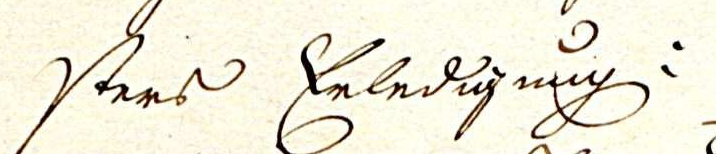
sters Erledigung:
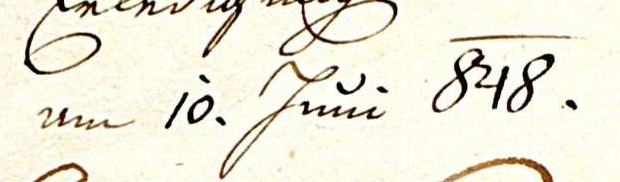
Am 10. Juni 1848
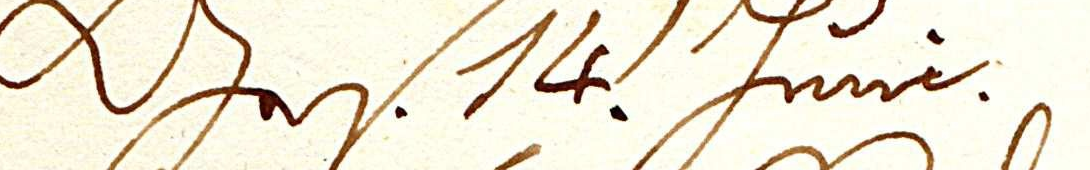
Ges. 14. Juni
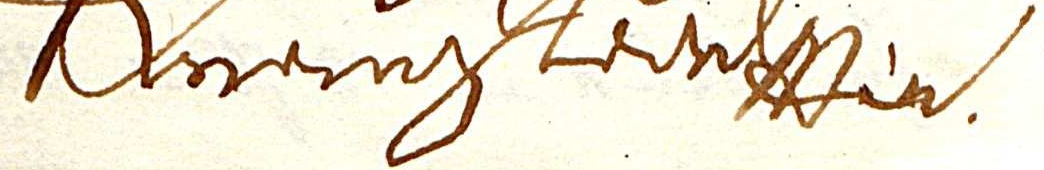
Franz Karl min.
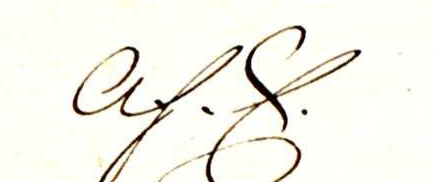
Ah E.
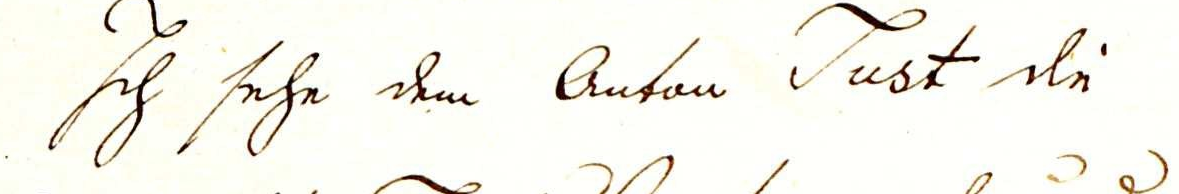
Ich sehe dem Anton Just die
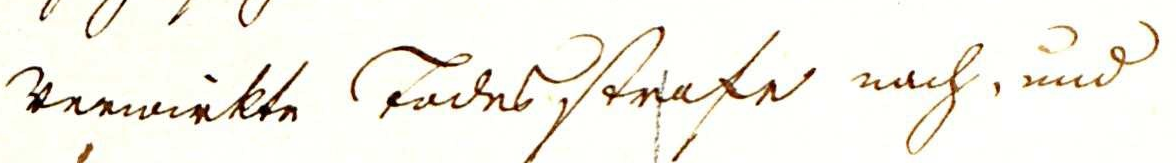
verwirkte Todesstrafe nach und
